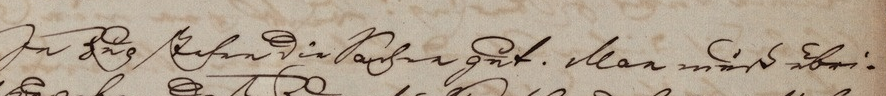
In Zug stehen die Sachen gut. Man muß übri-
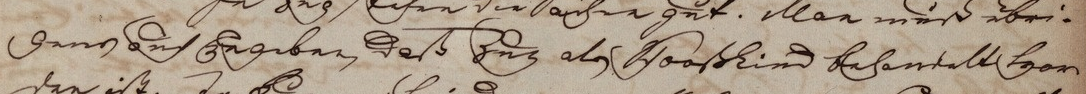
gens auch zugeben, daß Zug als Schooßkind behandelt wor-
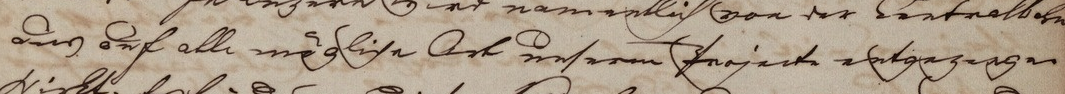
aus auf alle mögliche Art unserm Projecte entgegenge-
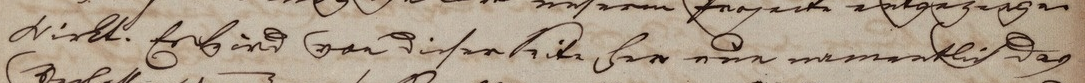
wirkt. Es wird von dieser Seite her nun namentlich das
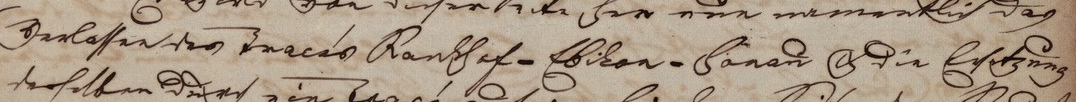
Verlassen des Tracés Rankhof – Ebikon – Honau & die Ersetzung
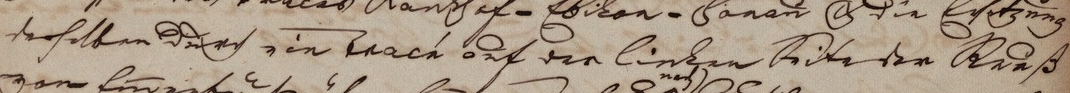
desselben durch ein Tracé auf der linken Seite der Reuß
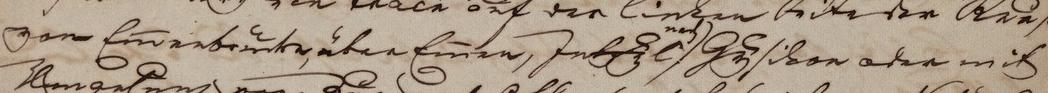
von Emmenbrücke, über Emmen, Inwyl, nachGysikon oder mit
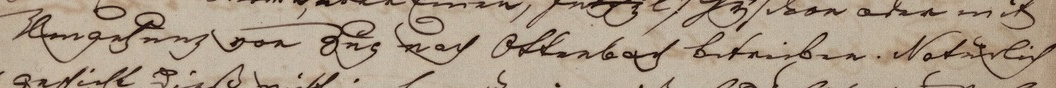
Umgehung von Zug nach Ottenbach betrieben. Natürlich
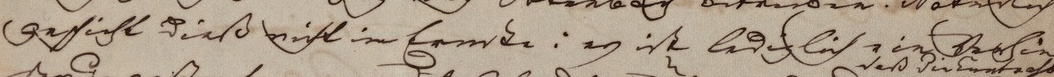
geschieht dieß nicht im Ernste: es ist lediglich ein Verhin-
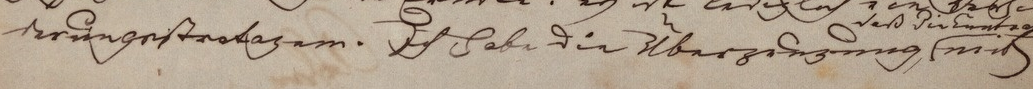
derungsstratagem. Ich habe die Überzeugung, daß die
